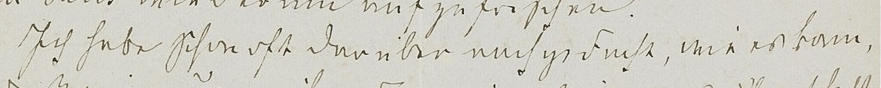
Ich habe schon oft darüber nachgedacht, wie es kam,
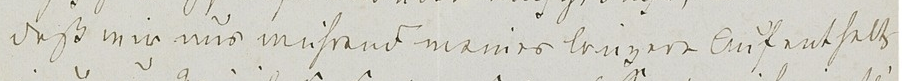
daß wir uns während meines längern Aufenthalts
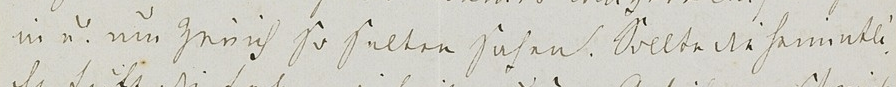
in u. um Zürich so selten sahen. Sollte die heimatli-
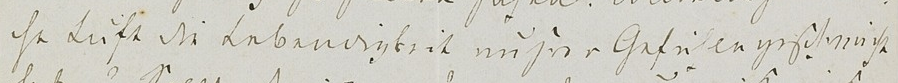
che Luft die Lebendigkeit unsrer Gefühle geschwächt
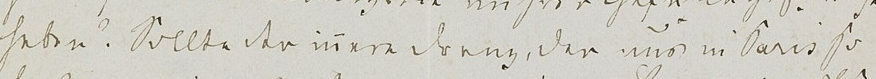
haben? Sollte der innere Drang, der uns in Paris so
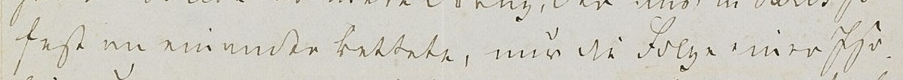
fest an einander kettete, nur die Folge einer Iso-
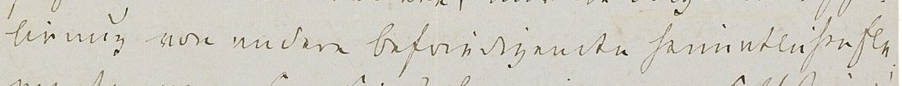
lierung von andern befriedigenden heimatlichen Ele-
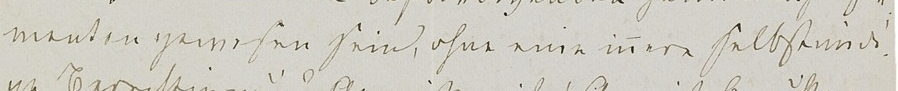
menten gewesen sein, ohne eine innere selbständi-
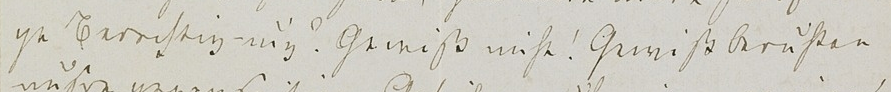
ge Berechtig-ung? Gewiß nicht! Gewiß beruhten
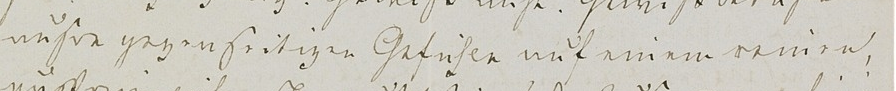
unsre gegenseitigen Gefühle auf einem reinen,
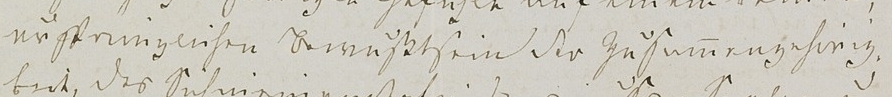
ursprünglichen Bewußtsein der Zusammengehörig-
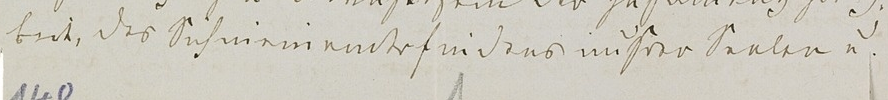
keit, des Sichineinanderfindens unsrer Seelen
